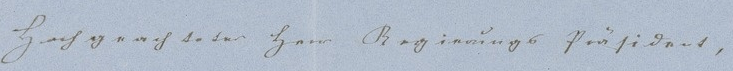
Hochgeachteter Herr Regierungs Präsident,
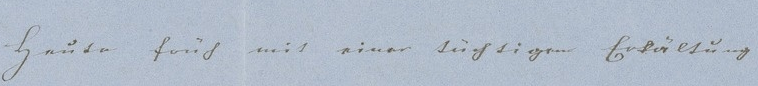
Heute früh mit einer tüchtigen Erkältung
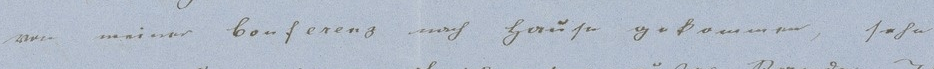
von meiner Conferenz nach Hause gekommen, sehe
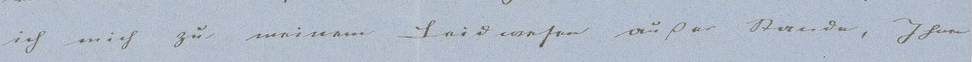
ich mich zu meinem Leidwesen außer Stande, Ihnen
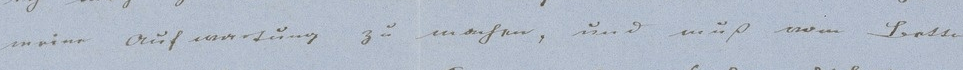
meine Aufwartung zu machen, und muß vom Bette
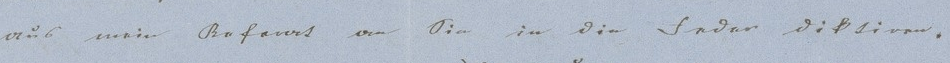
aus mein Referat an Sie in die Feder diktiren.
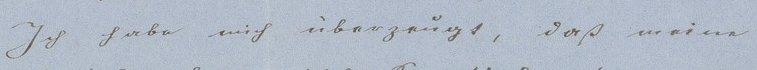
Ich habe mich überzeugt, daß meine
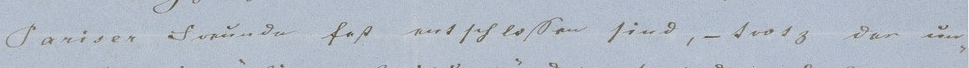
Pariser Freunde fest entschlossen sind, – trotz der un-
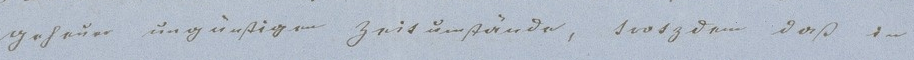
geheuer ungünstigen Zeitumstände, trotzdem daß in
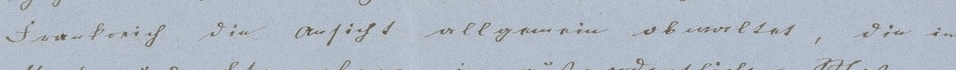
Frankreich die Ansicht allgemein obwaltet, die in
